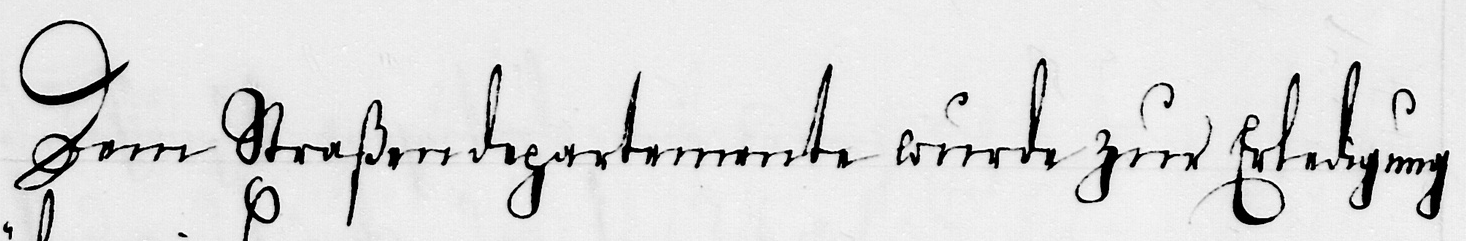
Dem Straßendepartemente wurde zur Erledigung
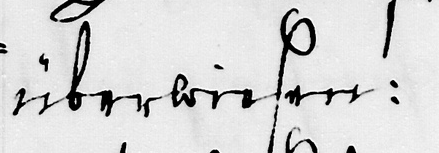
überwiesen:
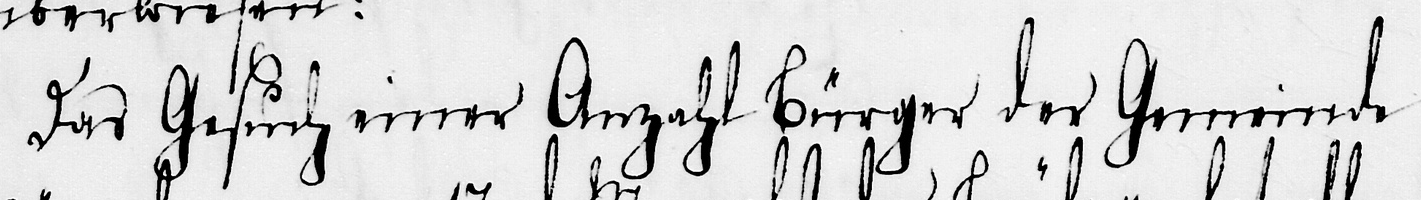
Das Gesuch einer Anzahl Bürger der Gemeinde
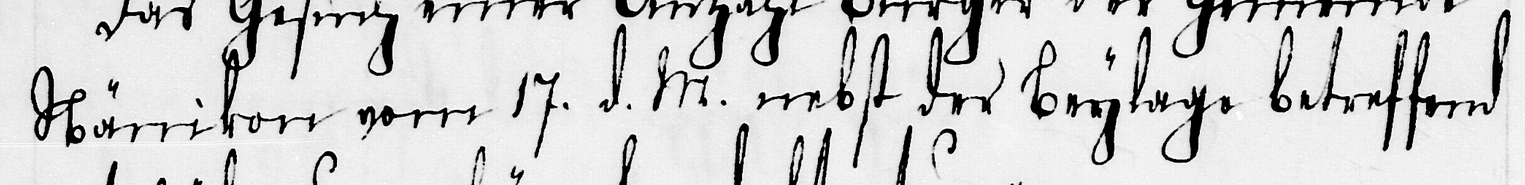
Nänikon vom 17. d. M. nebst der Beylage betreffend
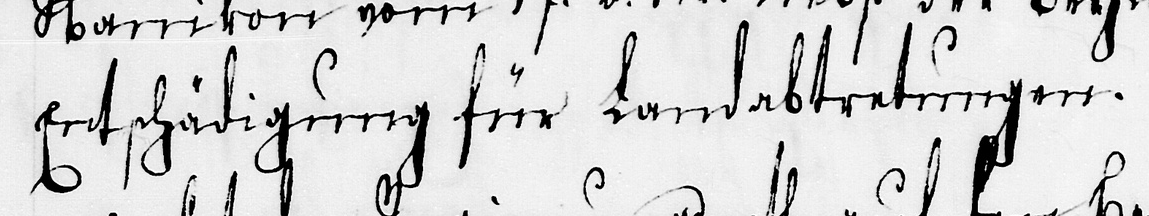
Entschädigung für Landabtretungen.
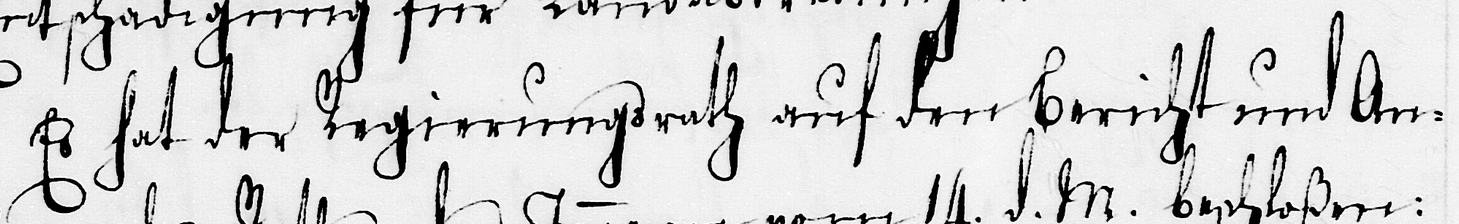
Es hat der Regierungsrath auf den Bericht und An¬
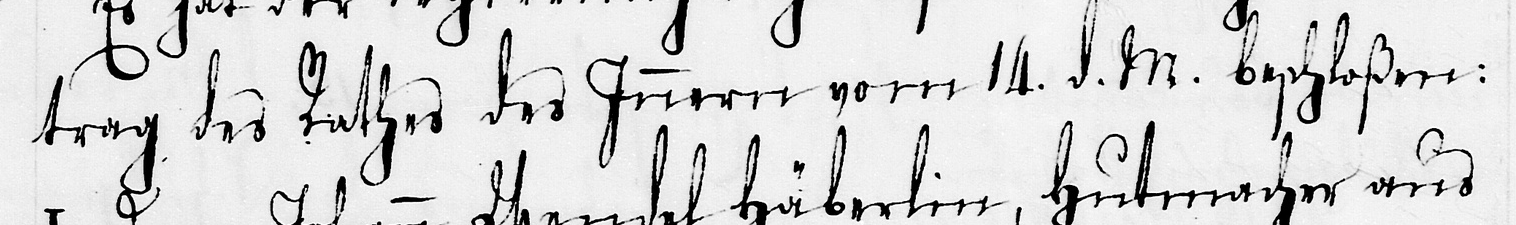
trag des Rathes des Innern vom 14. d. M. beschloßen:
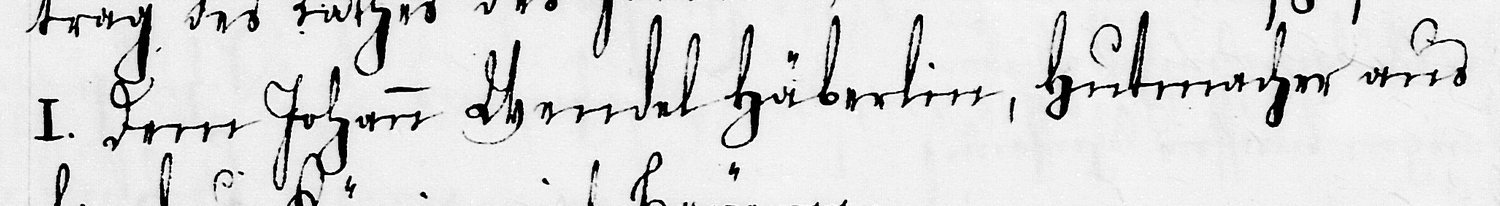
I. Dem Johann Wendel Häberlin, Hutmacher aus
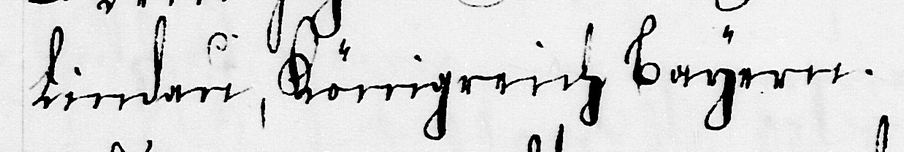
Lindau, Königreich Bayern.
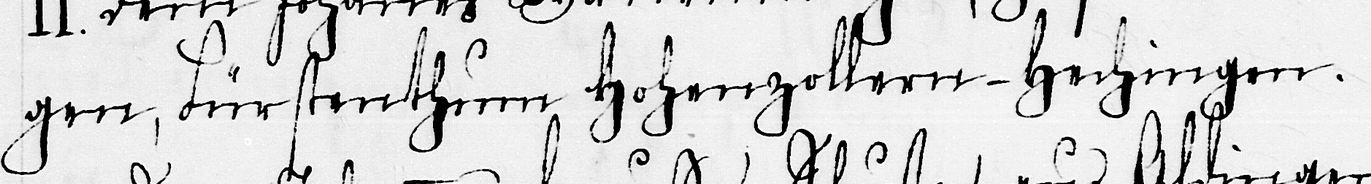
gen, Fürstenthum Hohenzollern-Hechingen.
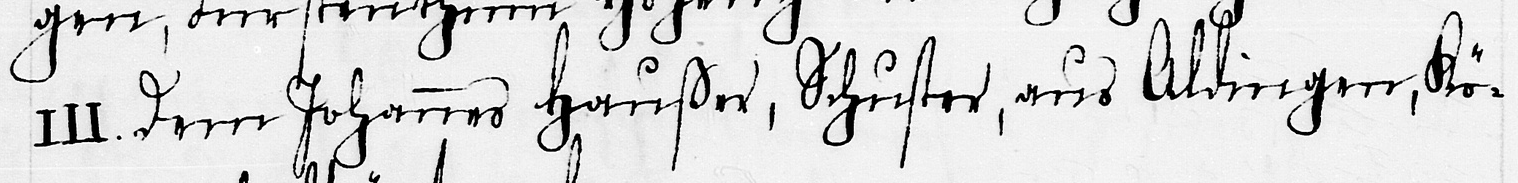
II. Dem Johannes Haußer, Schuster, aus Aldingen, Kö¬
